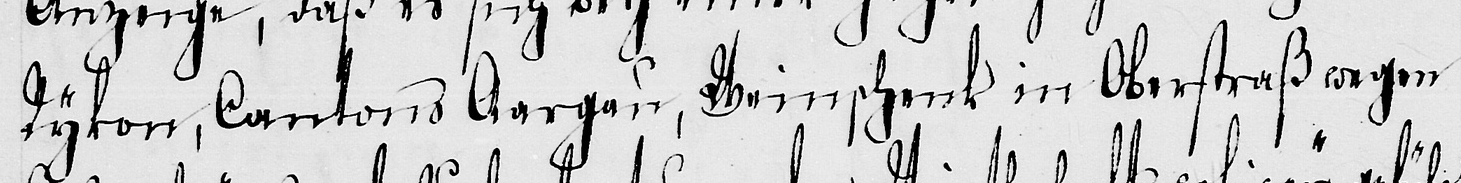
Rykon, Cantons Aargau, Weinschenk in Oberstraß wegen
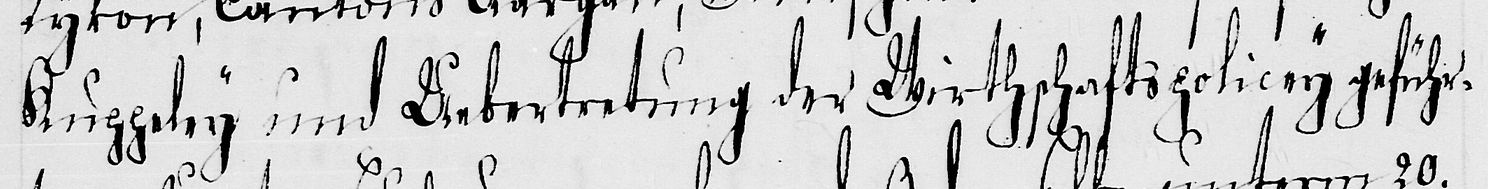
Kuppeley und Uebertretung der Wirthschaftspolicey gefüh¬
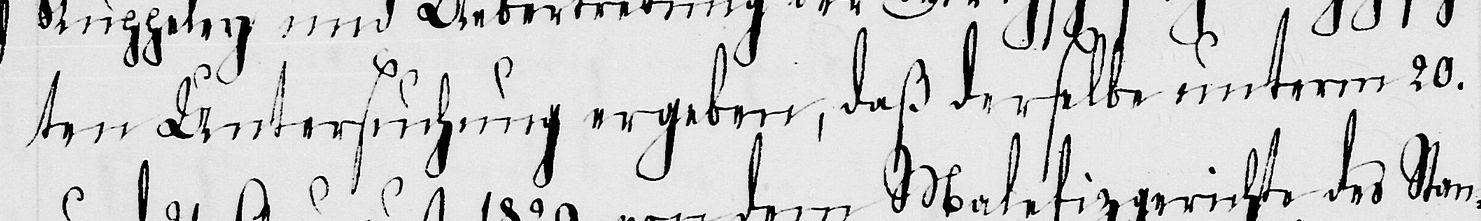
rten Untersuchung ergeben, daß derselbe unterm 20.
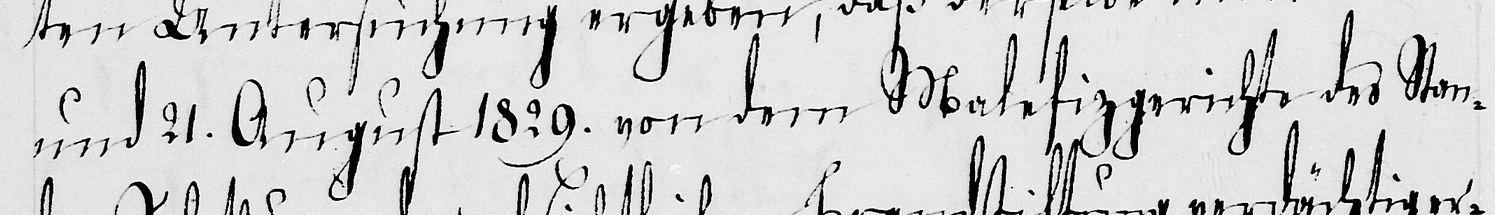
und 21. August 1829. von dem Malefizgerichte des Stan¬
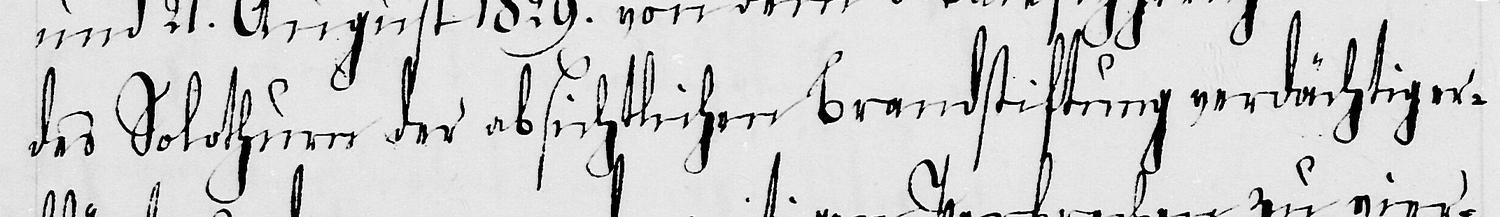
des Solothurn der absichtlichen Brandstiftung verdächtig e¬
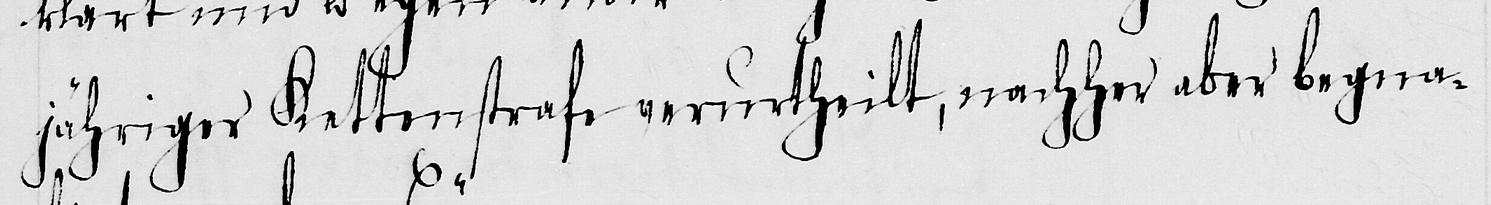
jähriger Kettenstrafe verurtheilt, nachher aber begna¬
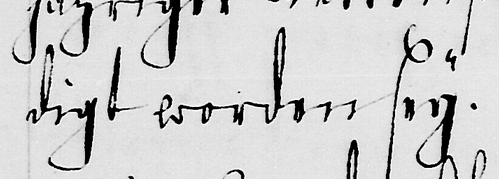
digt worden sey.
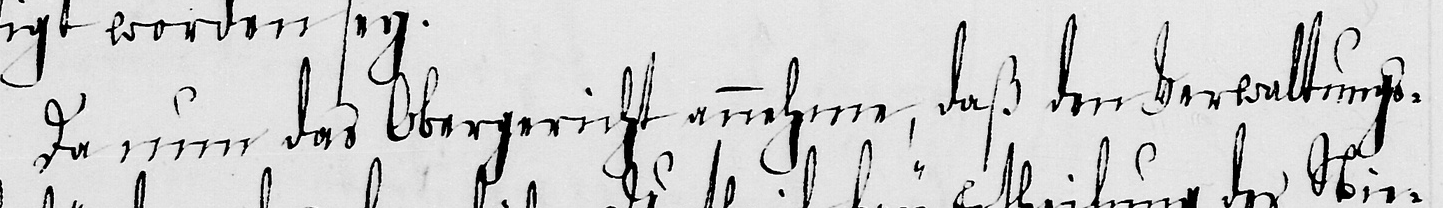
Da nun das Obergericht annehme, daß den Verwaltungs¬
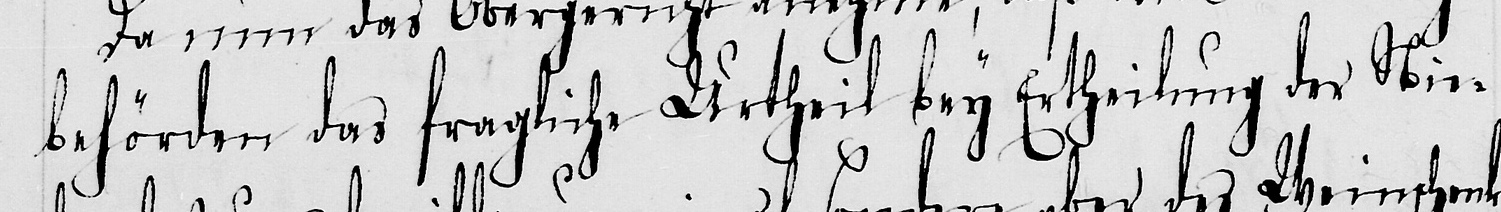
behörden das fragliche Urtheil bey Ertheilung der Nie¬
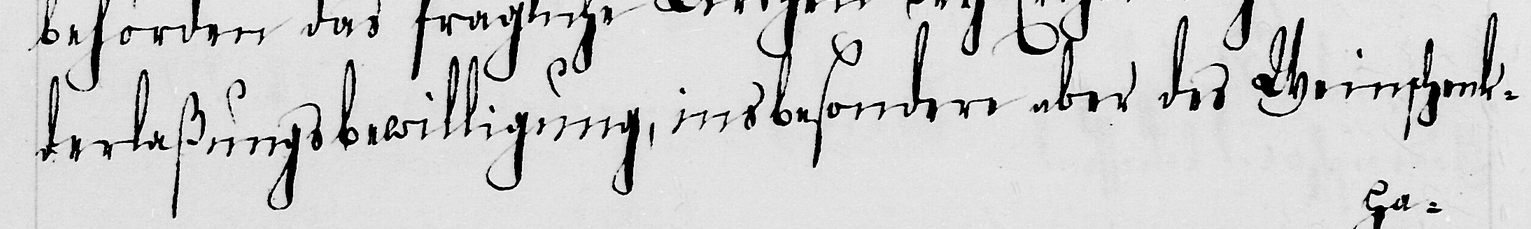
derlaßungsbewilligung, insbesondere aber des Weinschenk-
